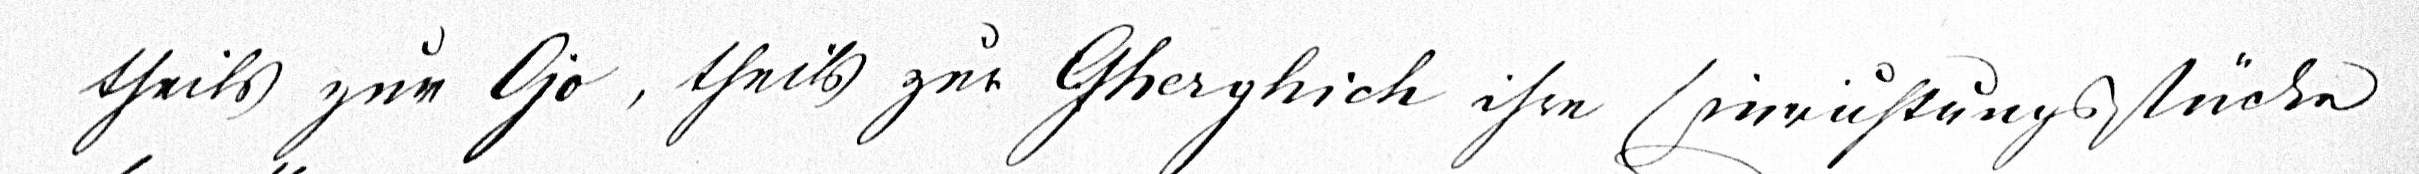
theils zur Ojo, theils zur Gherghich ihre Einrichtungsstücke
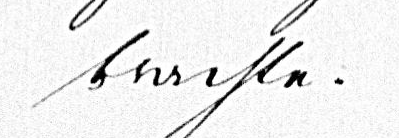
trachte.
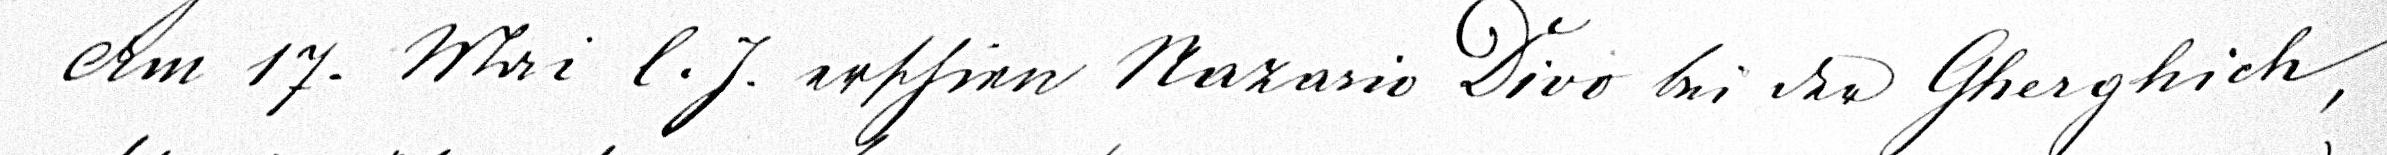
Am 17. Mai l.J. erschien Nazario Divo bei der Gherghich,
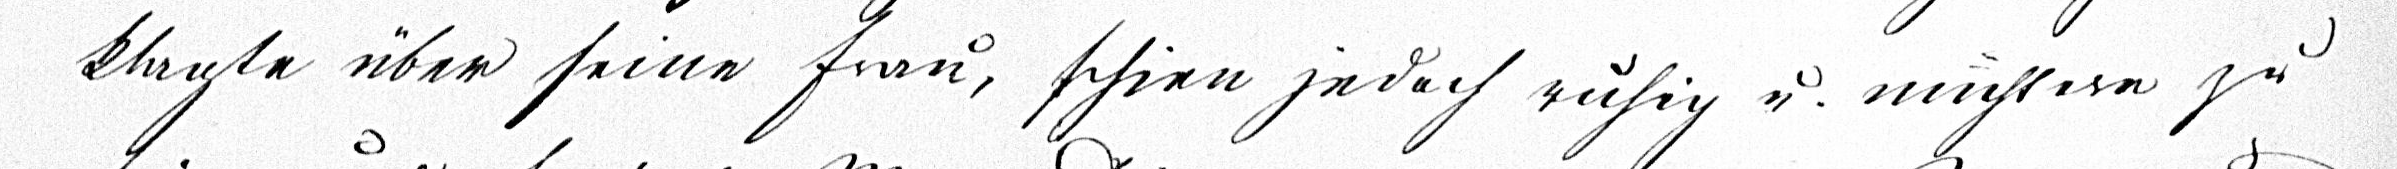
klagte über seine Frau, schien jedoch ruhig u. xx zu
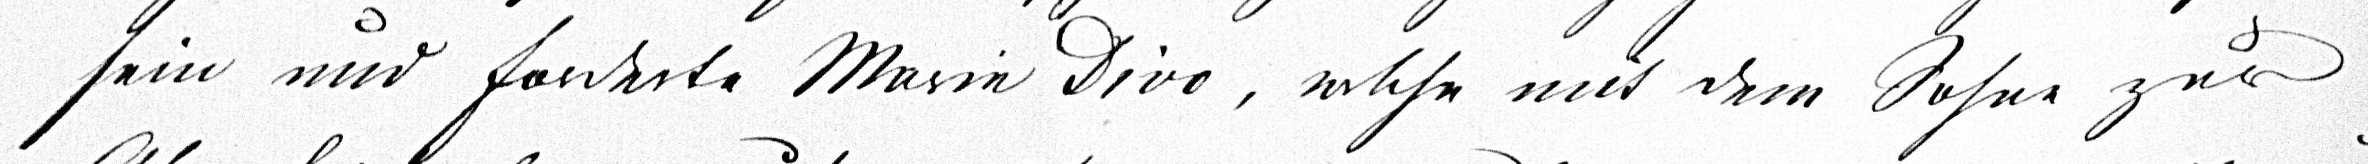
sein nur Forderte Marie Divo, welche mit dem Sohne zur
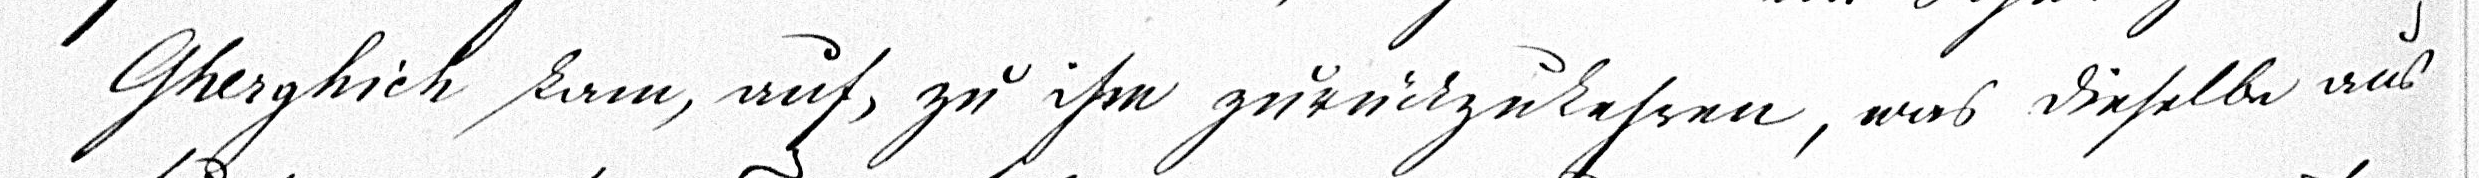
Gherghich kam, auf, zu ihm zurückzukehren, was dieselbe aus
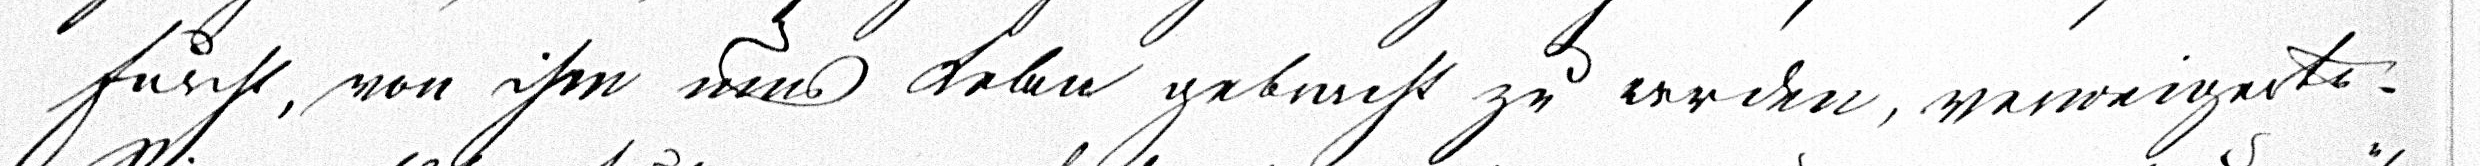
Furcht, von ihm ums Kolxx gebracht zu werden, verweigerte.
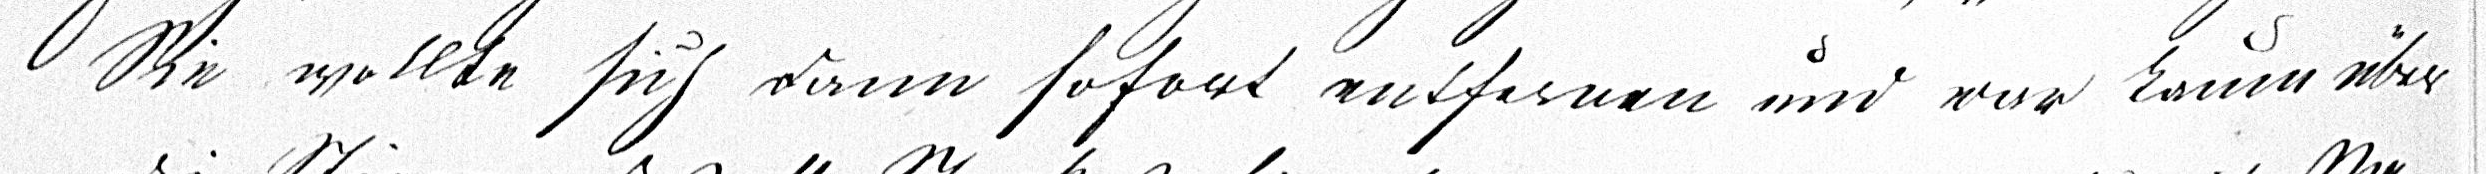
Sie wollte sich dann sofort entfernen und vor kaum über
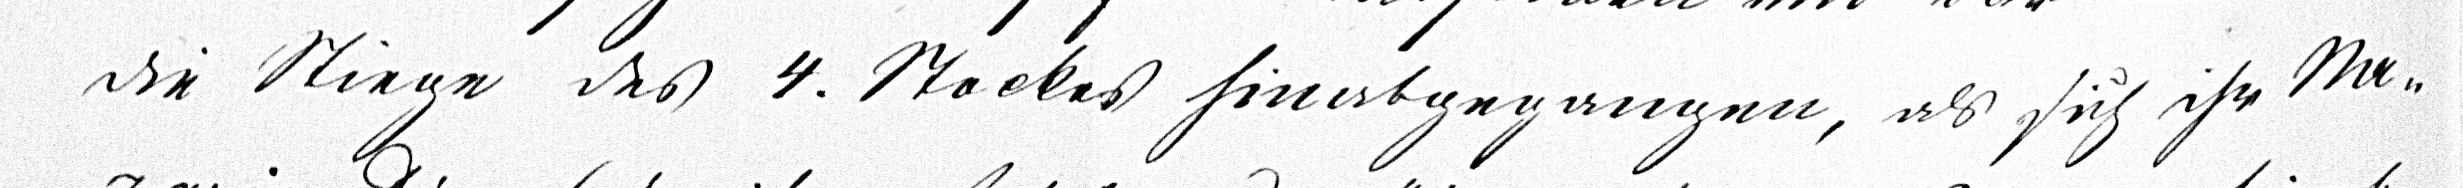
die Stiege des 4. Stockes hinabgegangen, als sich ihr Na¬
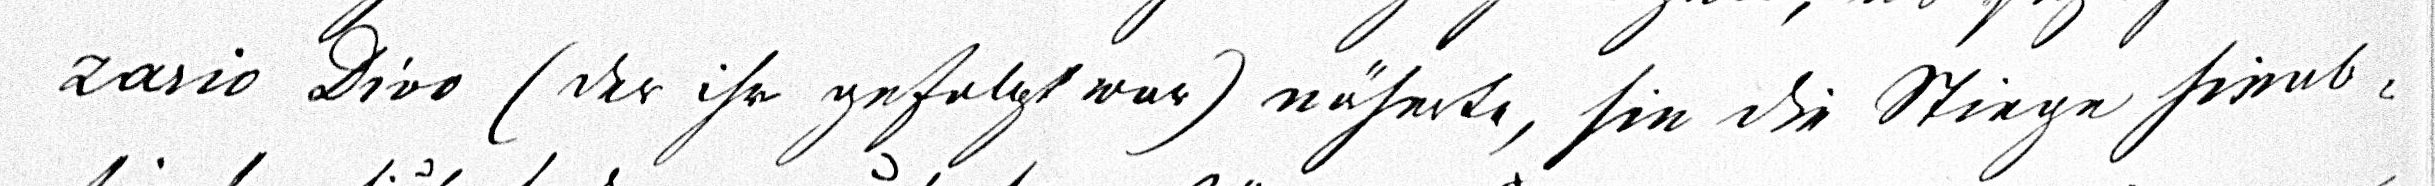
zario Divo (der ihr gefolgt war) näherte, sie die Stiege hinab¬
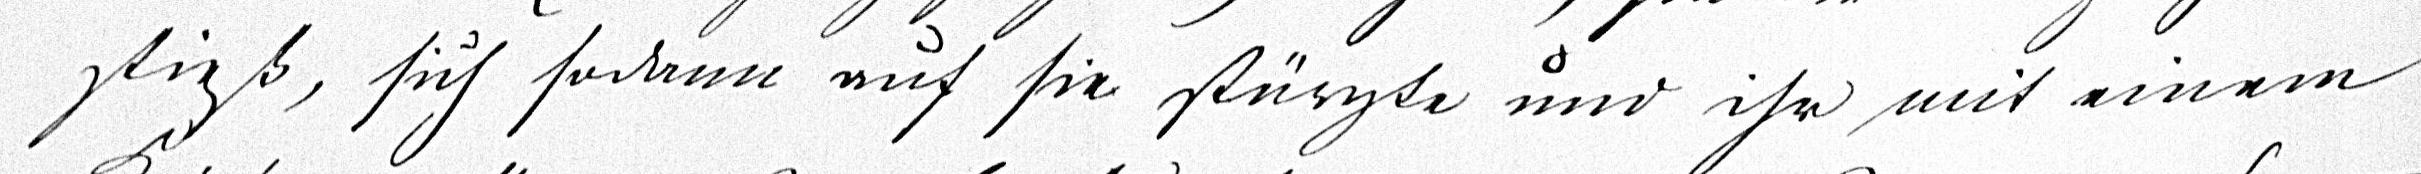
stixx, sich sodann auf sie stürzte und ihr mit einem
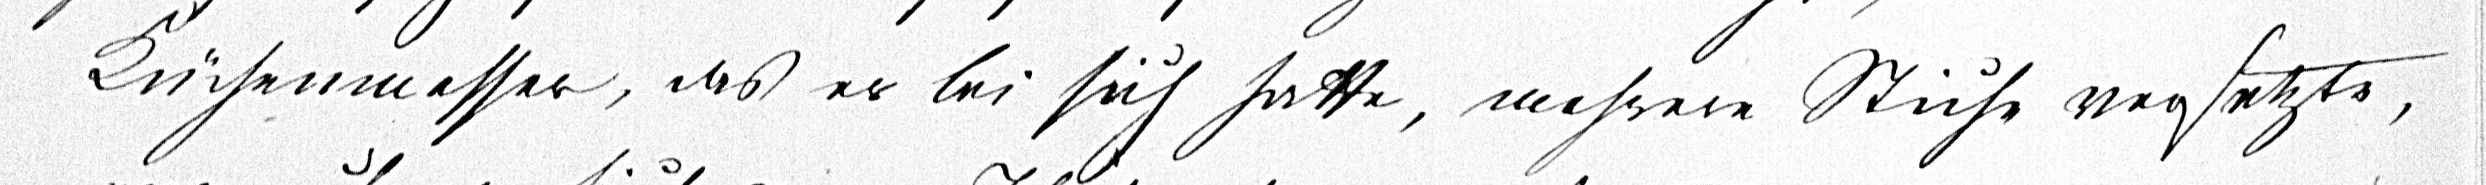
Küchenmesser, das er bei sich hatte, mehrere Stiche versetzte,
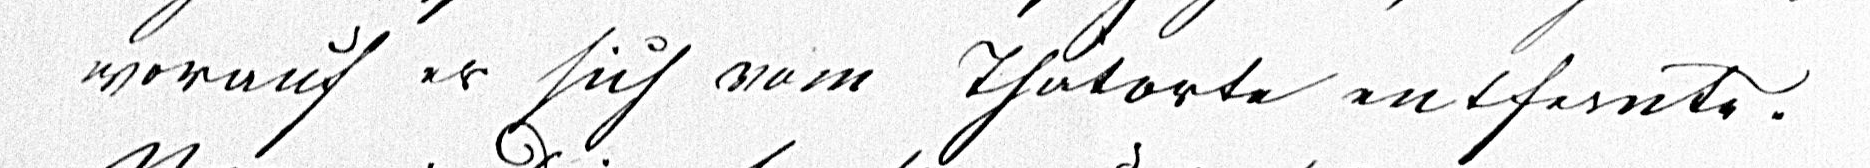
worauf er sich vom Thatorte entfernte.
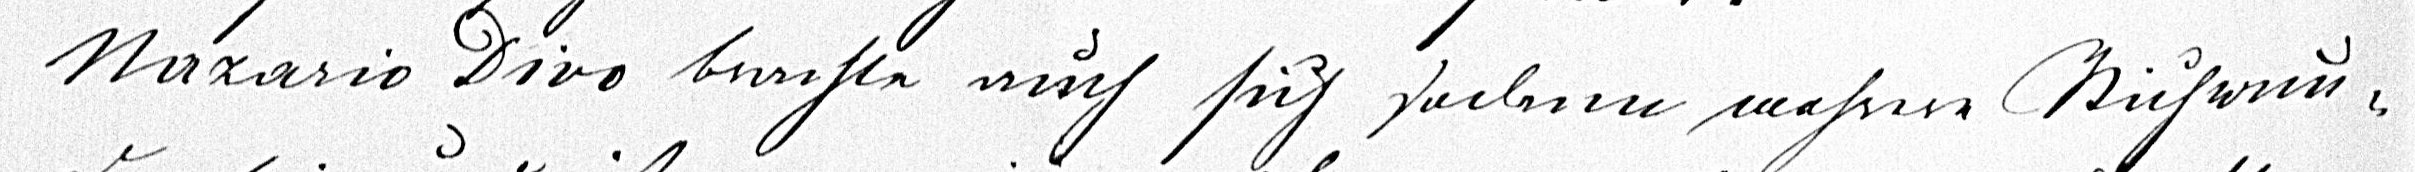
Nazario Divo brachte auch sich sodann mehrere Stichwun¬
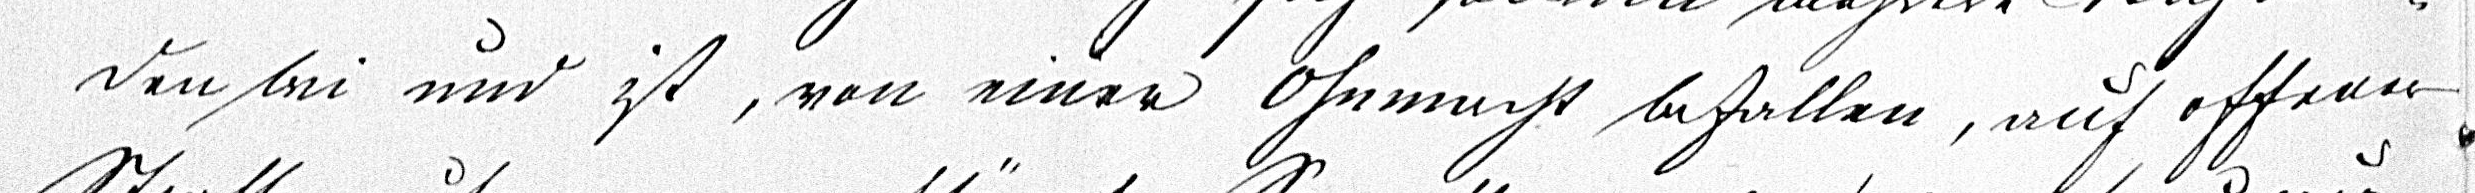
den bei und ist, von einer Ohnmacht befallen, auf offener
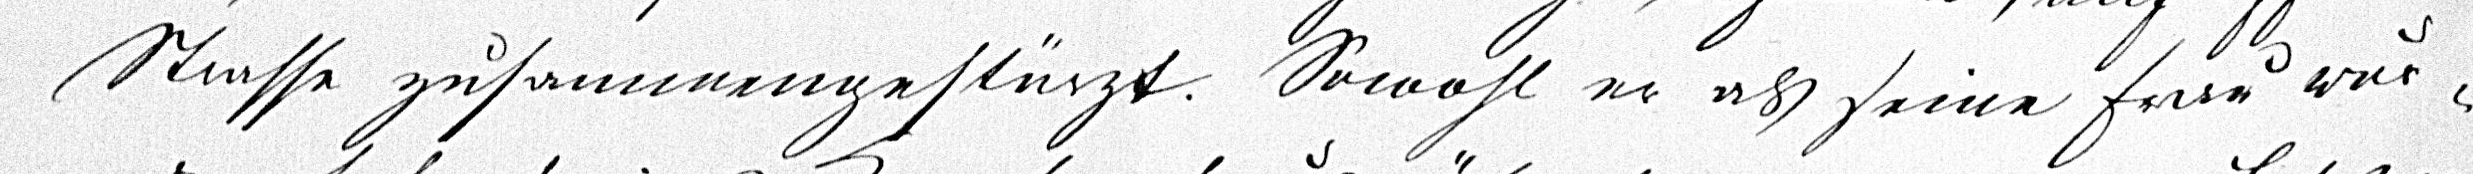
Strasse zusammengestürzt. Sowohl er als seine Frau wur¬
